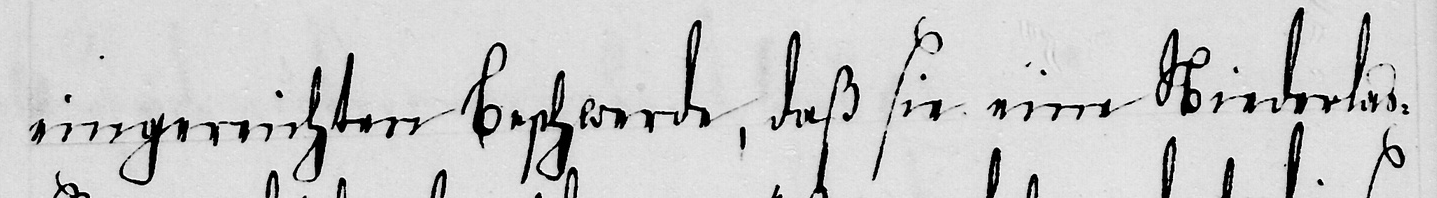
eingereichten Beschwerde, daß sie eine Niederla¬
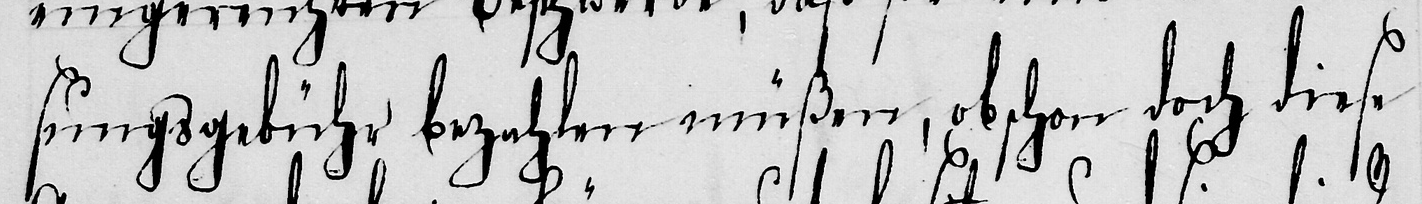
ßungsgebühr bezahlen müßen, obschon doch diese
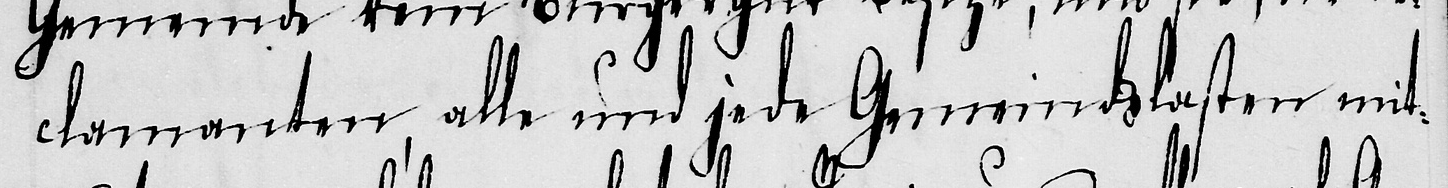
clamanten, alle und jede Gemeindslasten mit¬
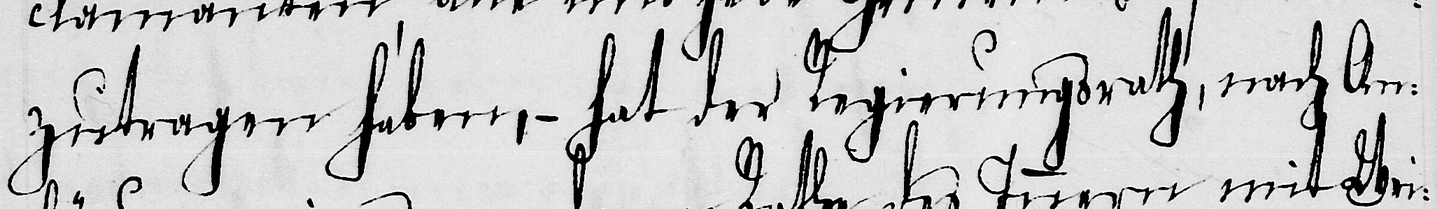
zutragen haben, – hat der Regierungsrath, nach An¬
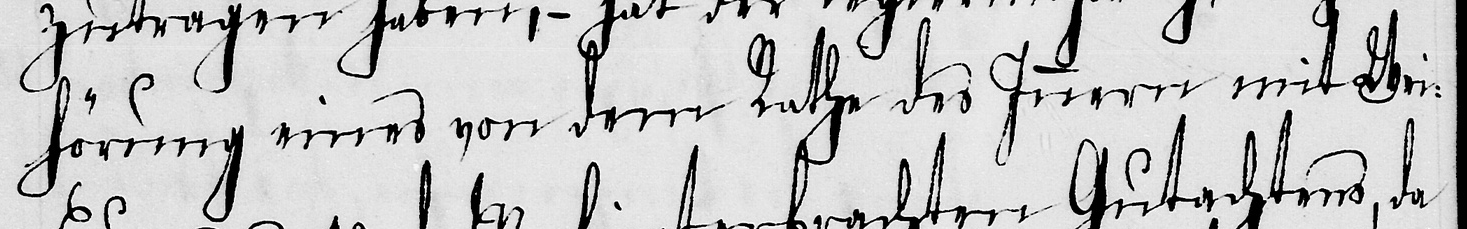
hörung eines von dem Rathe des Innern mit Wei¬
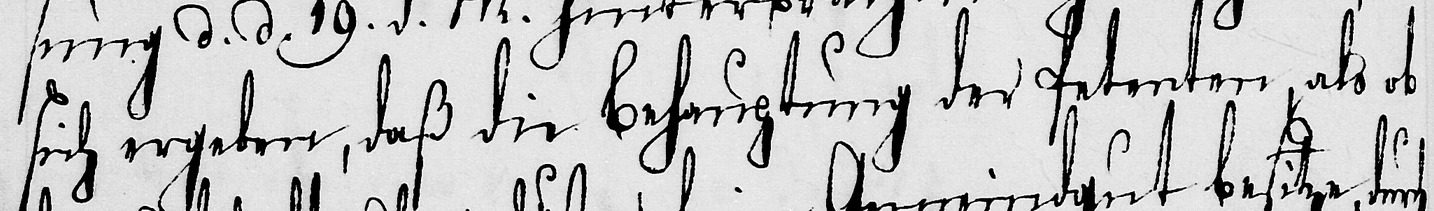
sich ergeben, daß die Behauptung der Petenten, als
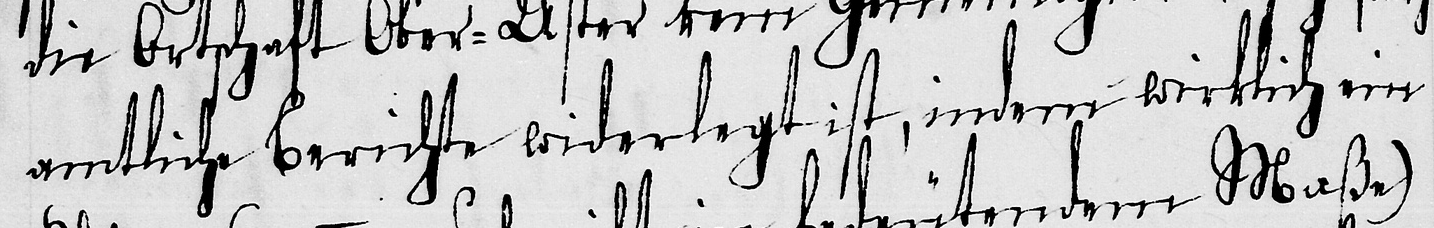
amtliche Berichte widerlegt ist; indem wirklich ein
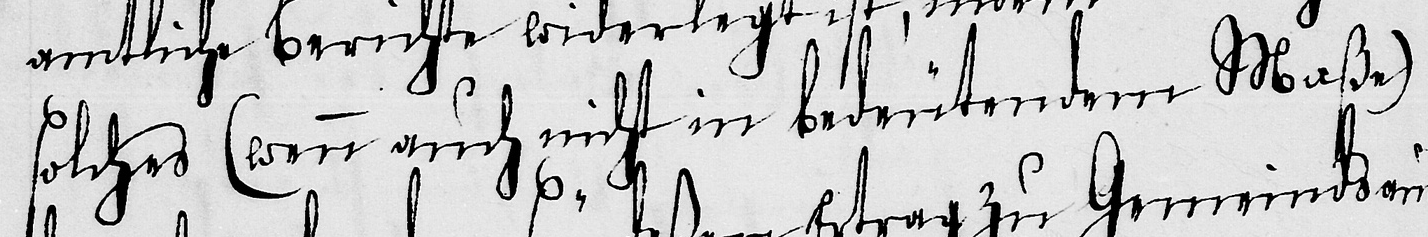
solches (wenn auch nicht in bedeutendem Maße)
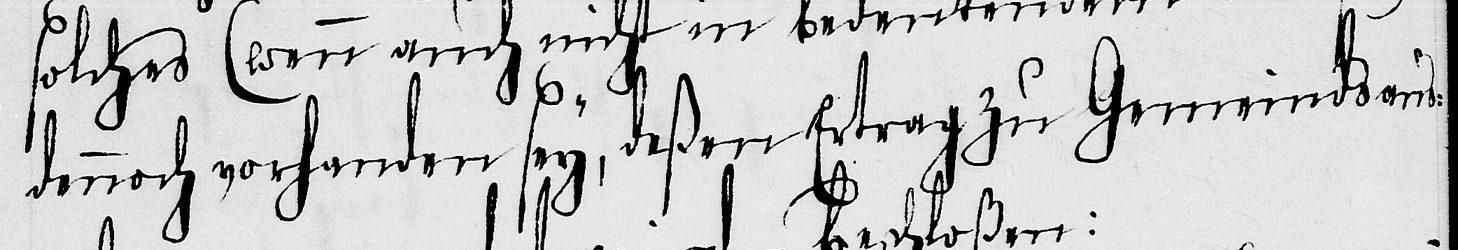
dennoch vorhanden sey, deßen Ertrag zu Gemeindsau¬
